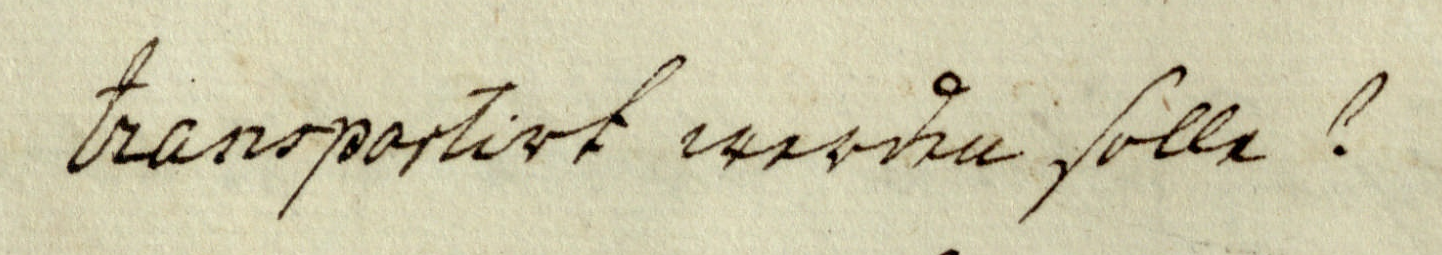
transportirt werden solle?
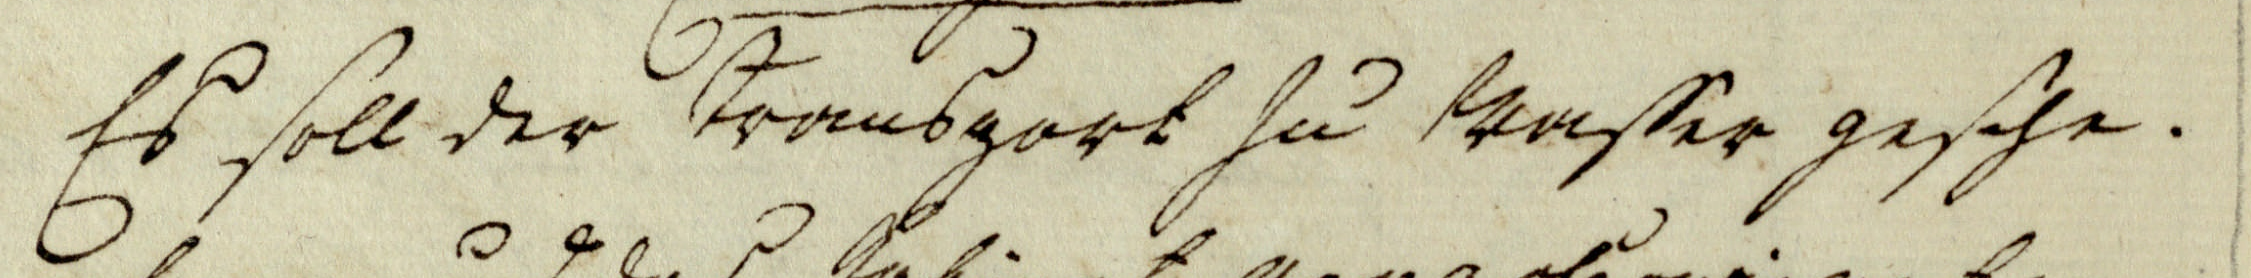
Es soll der Transort zu Wasser gesche¬
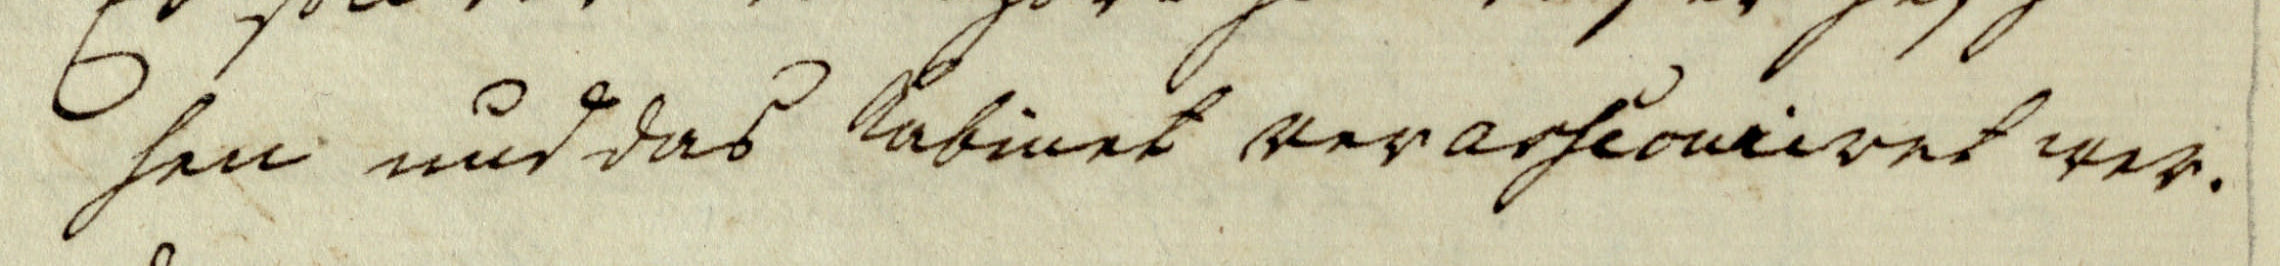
hen und das Kabinet verassecuriret wer¬
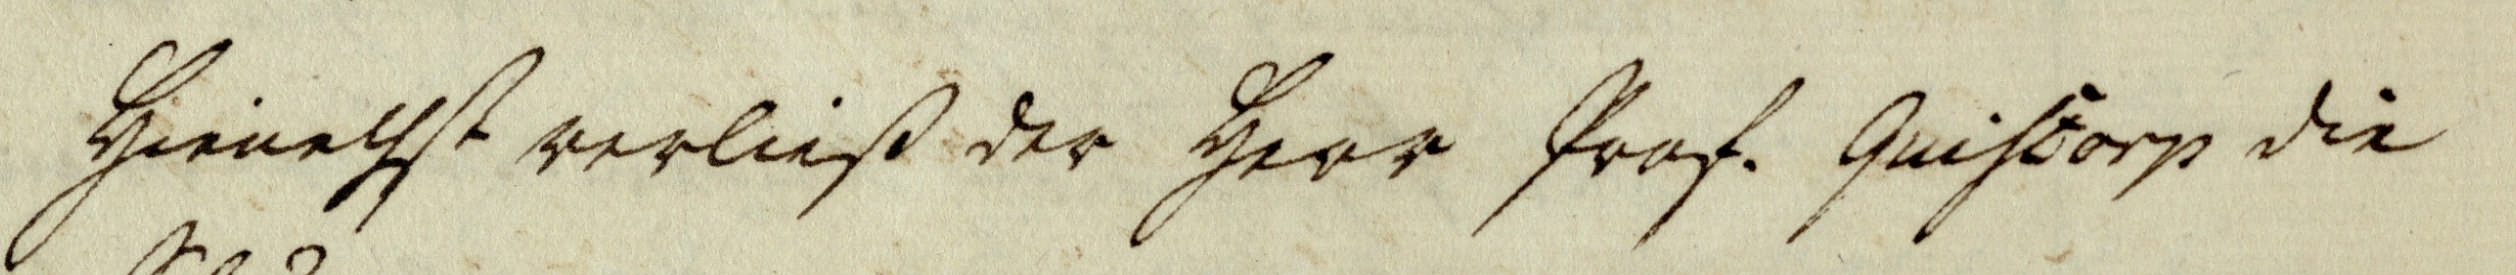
Hienechst verließ der Herr Prof. Quistorp die
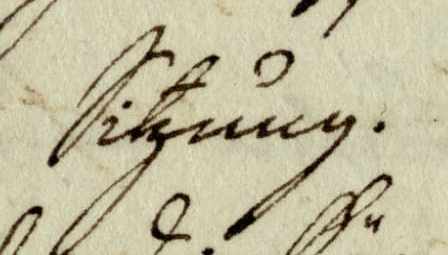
Sitzung.
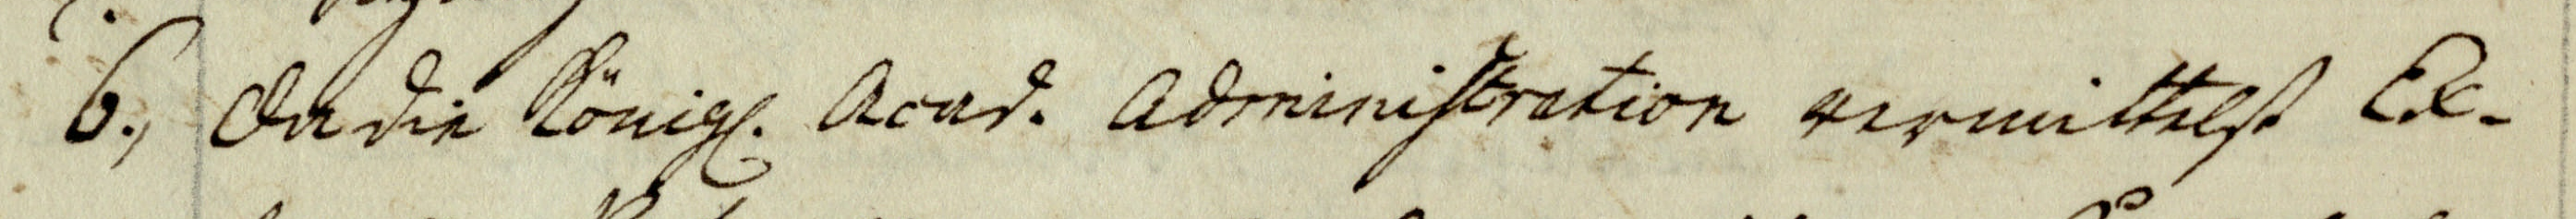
6., Die Königl. Acad. Administration vermittelst Ex¬
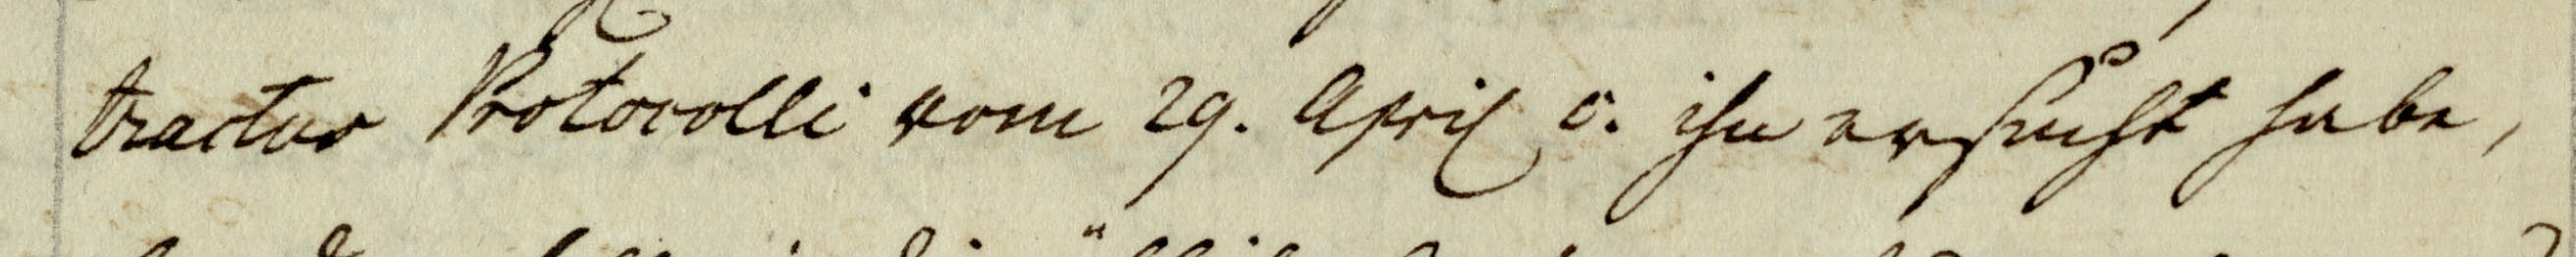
tractus Protocolli vom 29. April. c. ihn ersucht habe,
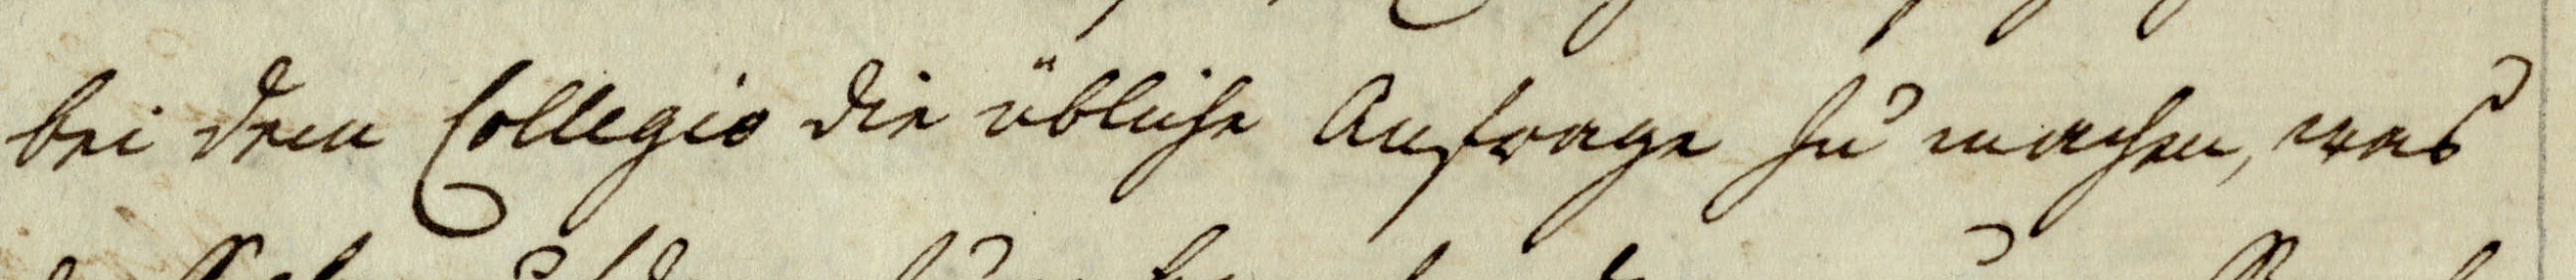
bei dem Collegio die übliche Anfrage zu machen, was
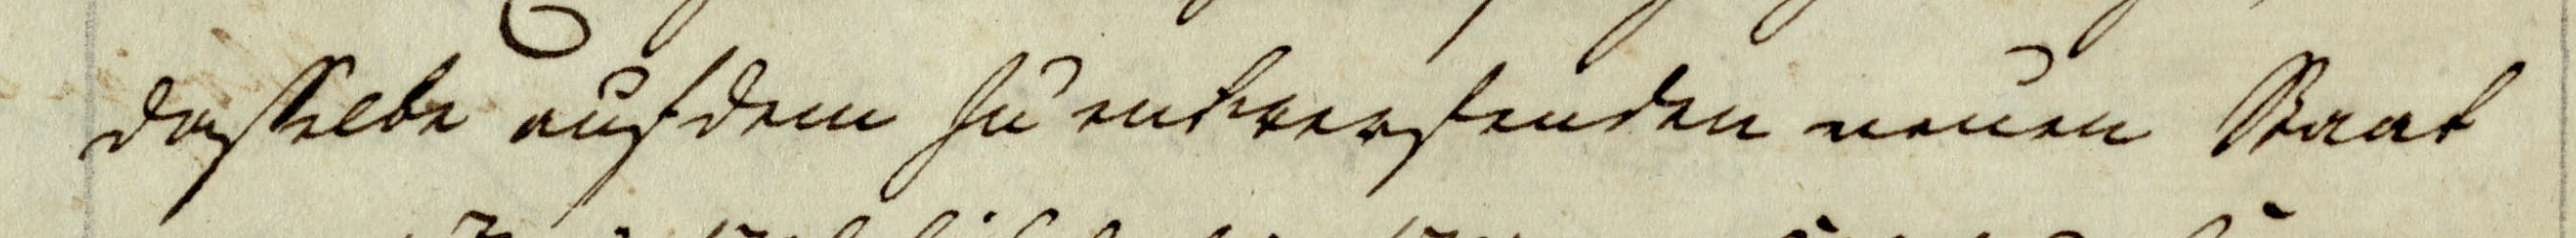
dasselbe auf dem zu entwerfenden neuen Staat
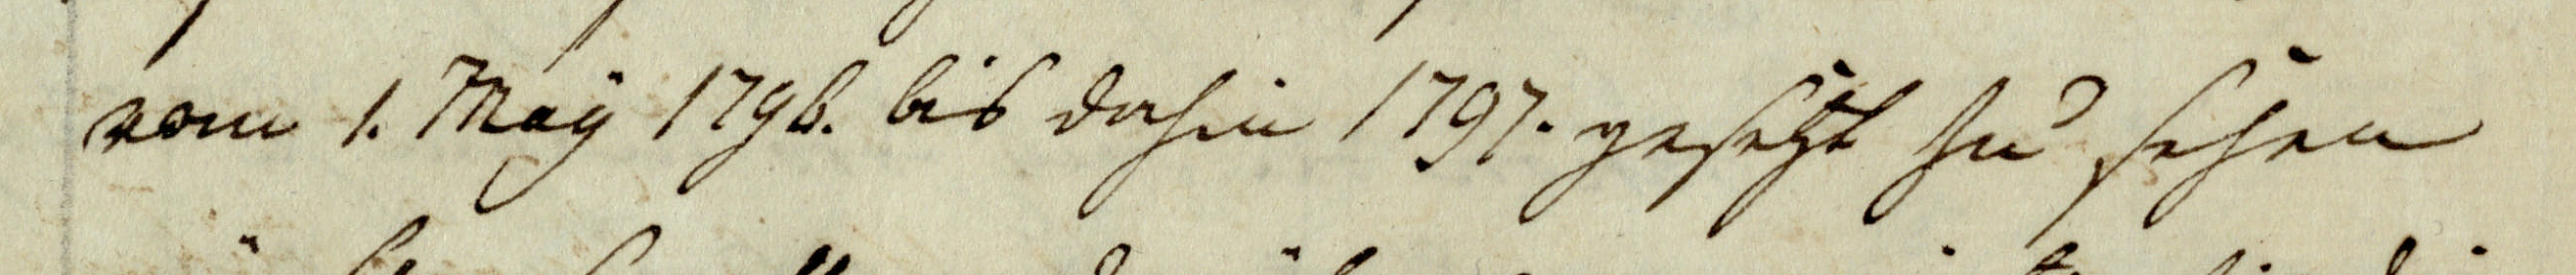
vom 1. Maÿ 1796. bis dahin 1797. gesetzt zu sehen
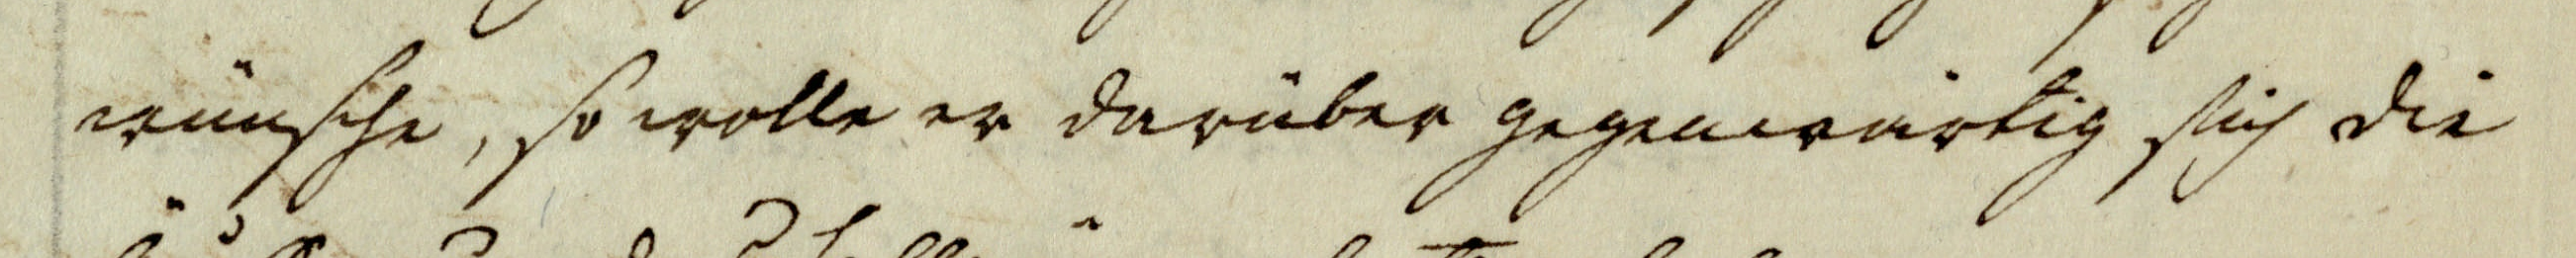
wünsche, so wolle er darüber gegenwärtig sich die
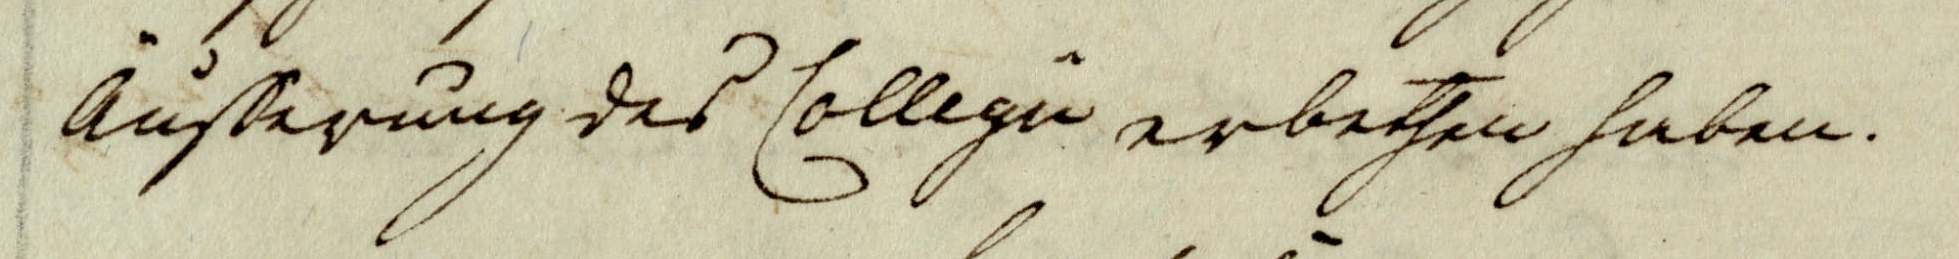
Äusserung des Collegii erbethen haben.
